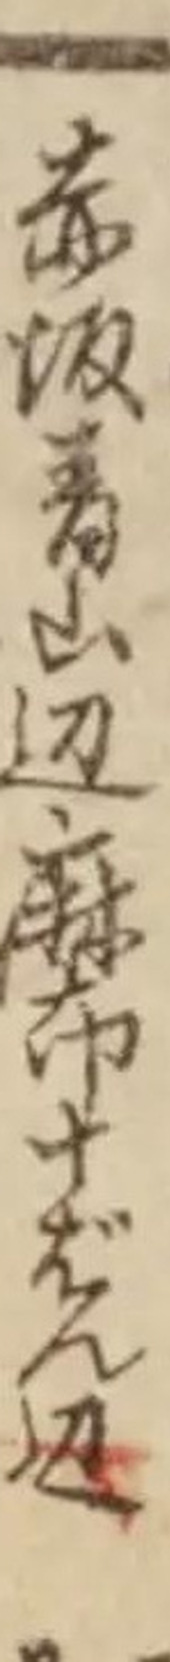赤坂青山辺麻布十ばん辺
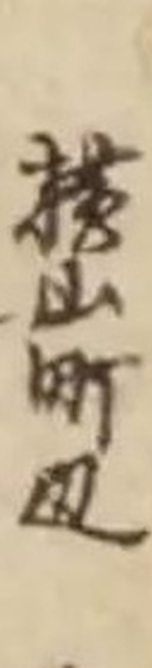横山町辺
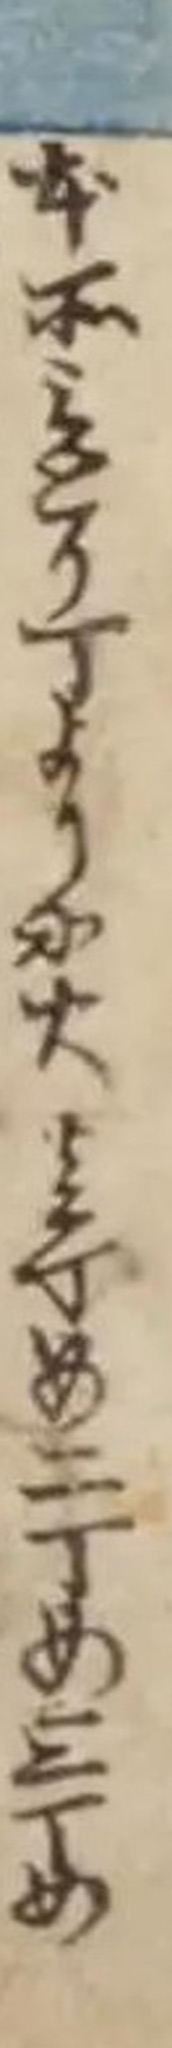本所みとり丁より出火上し丁め二丁め三丁め
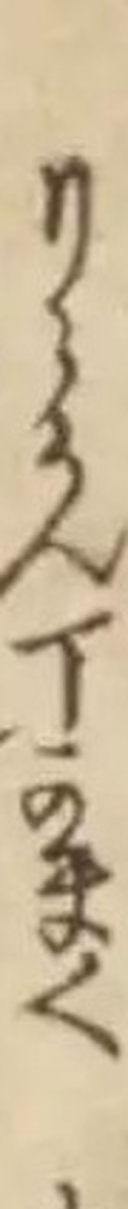りようん丁少かまく
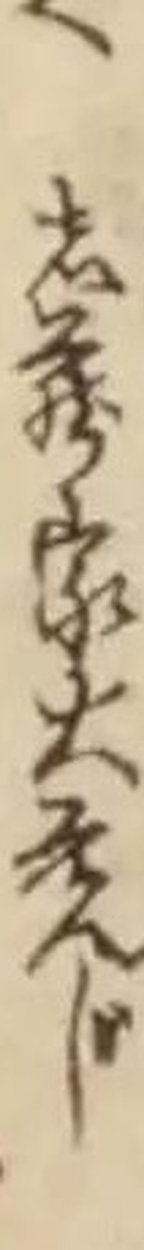し蔵家大そんじ
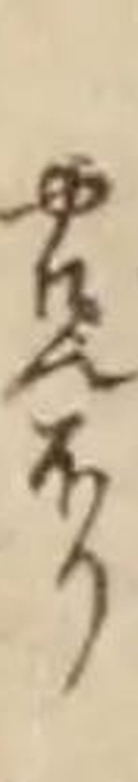やけんほり
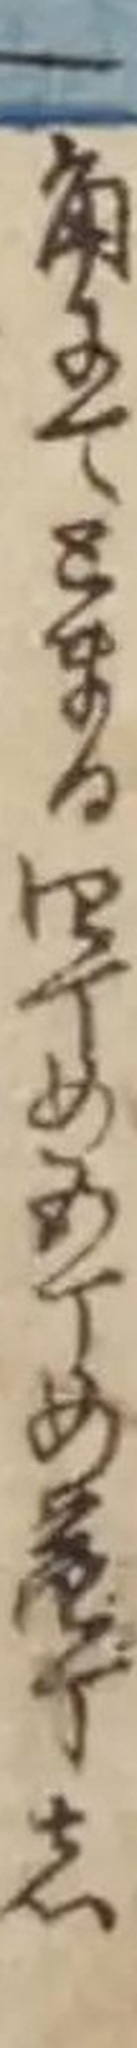角にてとまる四丁め五丁め篭丁し
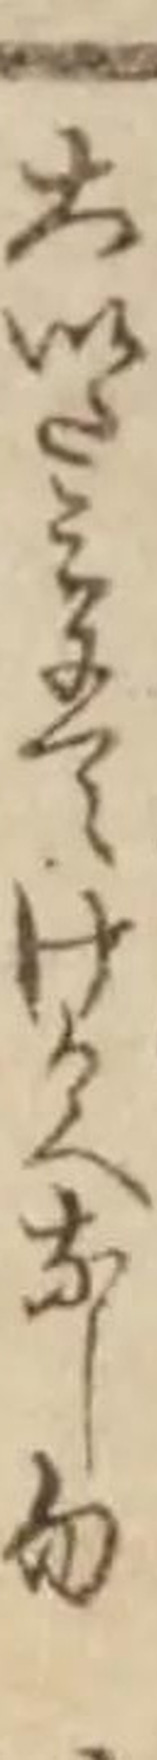大いたみにてけか人なし
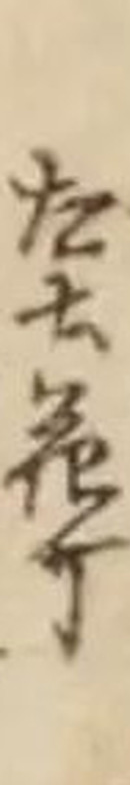たち花丁
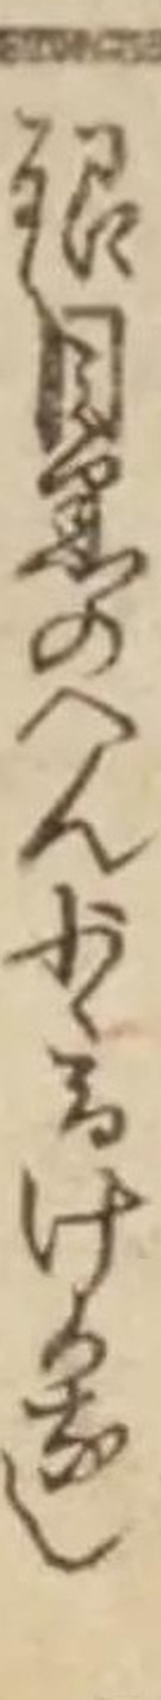銀目黒のへん少けかなし
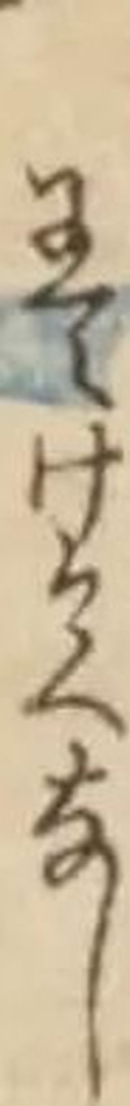にてけか人なし
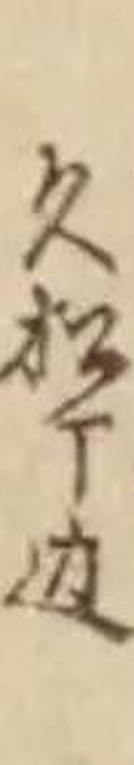久松丁辺
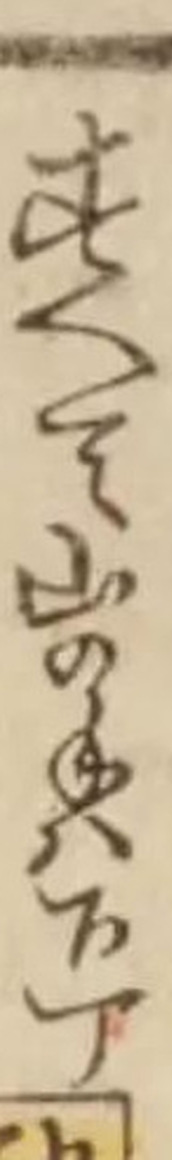すへて山の手は下丁
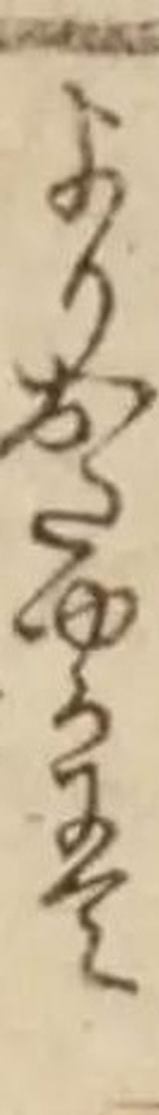よりおたやかにて
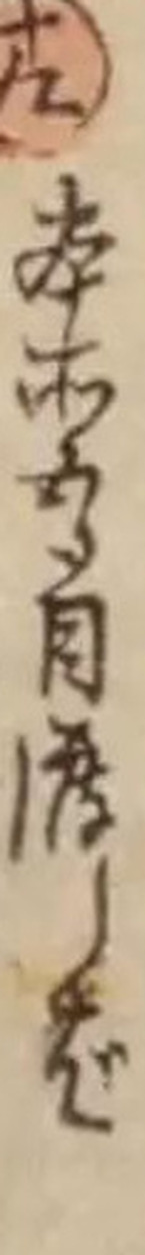本所五目渡しば
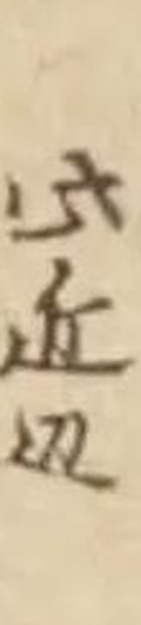此近辺
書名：銘細改板江戸大地震出火場所附
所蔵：国立国会図書館 National Diet Library, JAPAN
